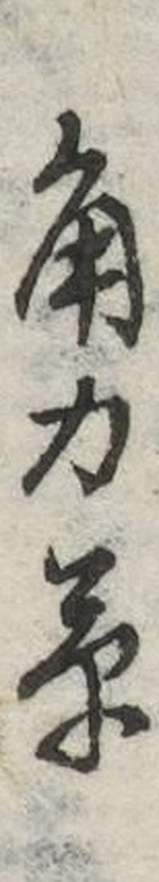角力草

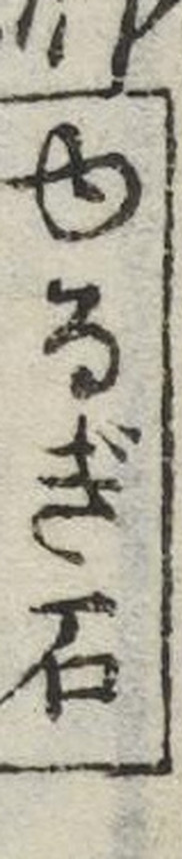ゆるぎ石
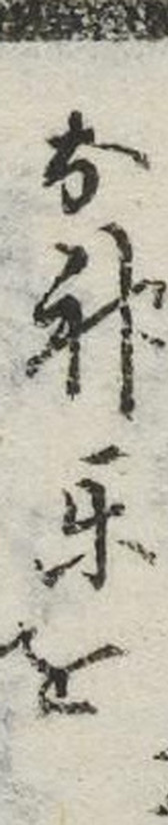お神楽を
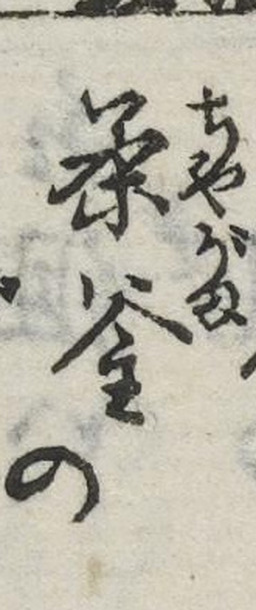茶釜の
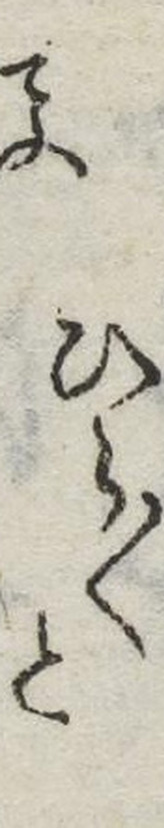ひら〳〵と
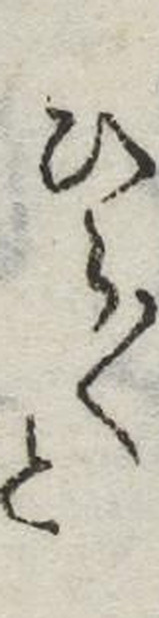ひら〳〵と
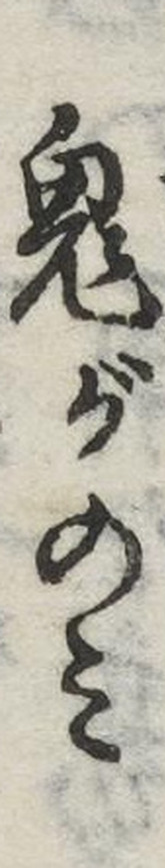鬼がのみ
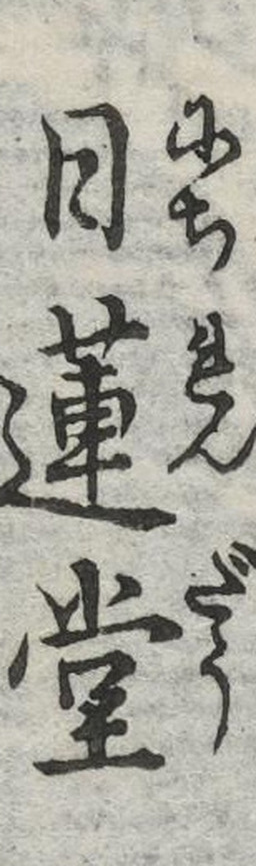日蓮堂
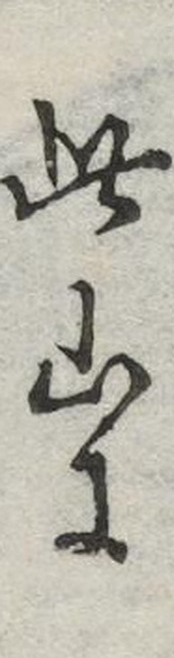此山に
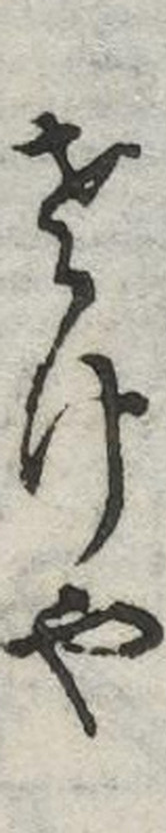さけや
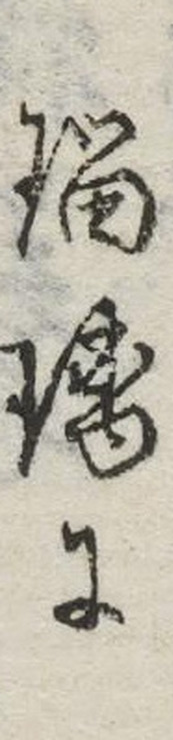瑠璃に
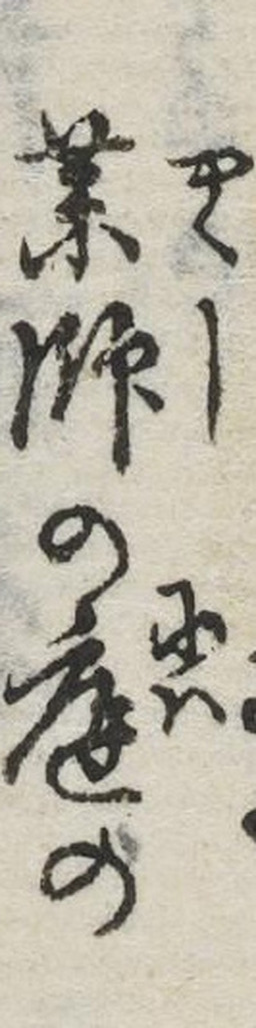薬師の庭の
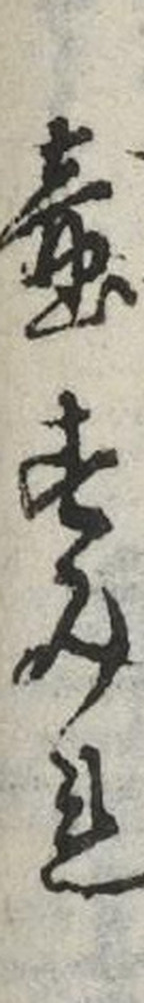壺すみれ
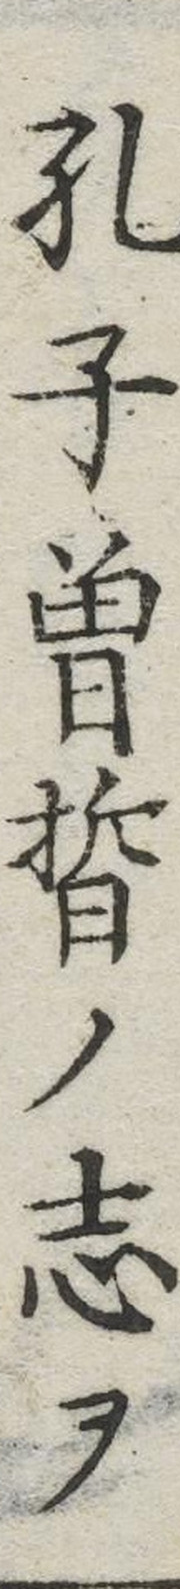孔子曽皙ノ志ヲ
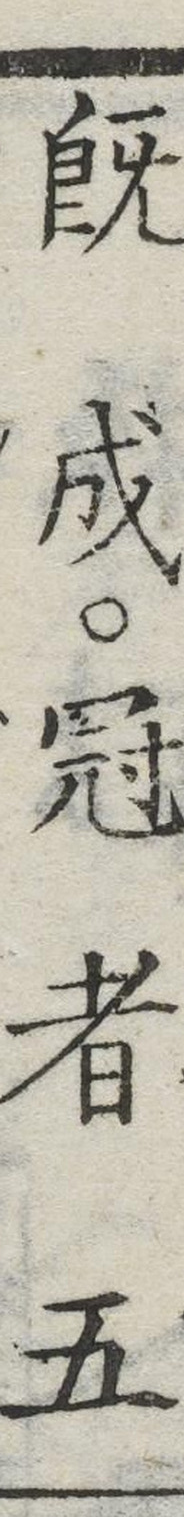既成。冠者五
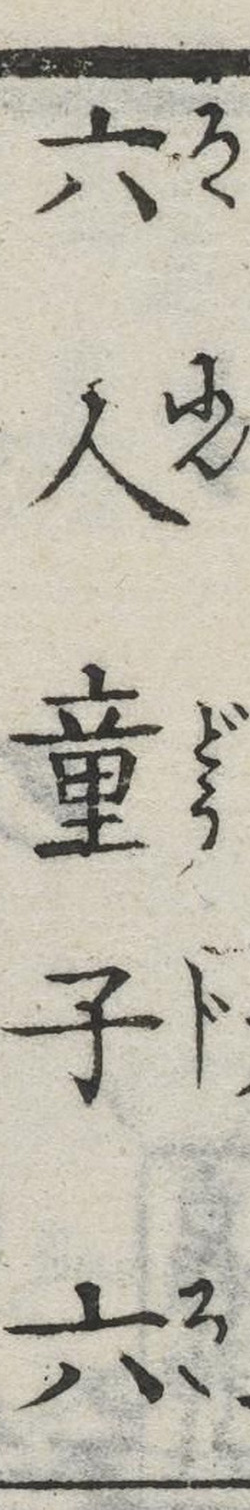六人童子六
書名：諸國温泉遊覽記　全
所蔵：東京大学地震研究所図書室 Earthquake Research Institute Library, The University of Tokyo, JAPAN
